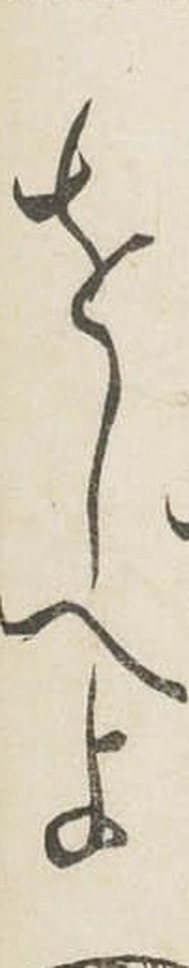をしへよ
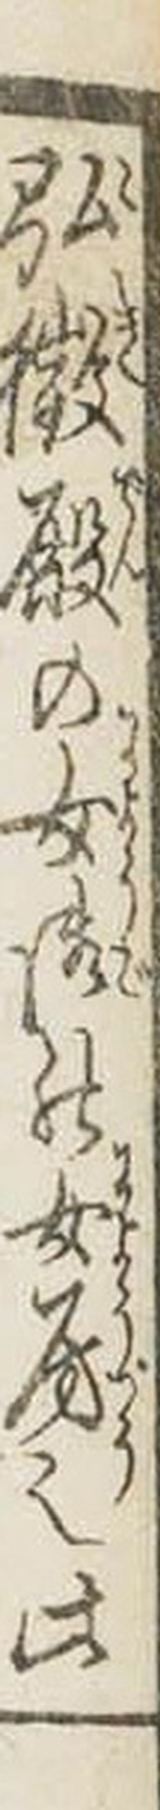弘徽殿の女御の女房也此
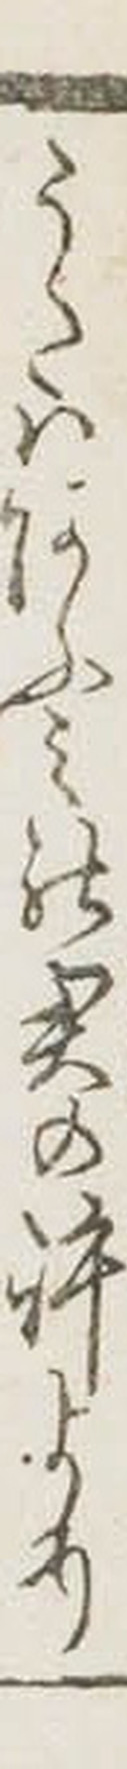うたはあふみの君の許より
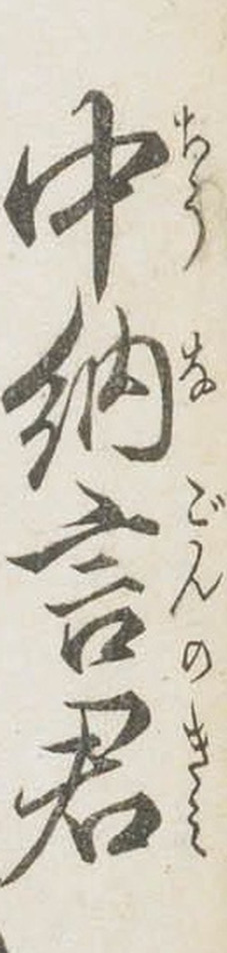中納言君
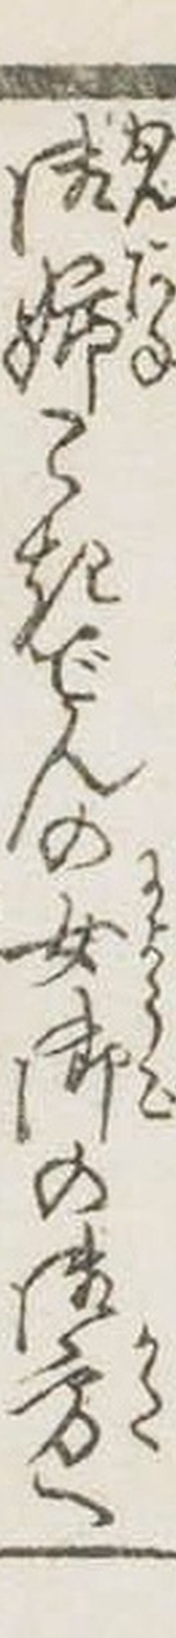御姉こきでんの女御の御方へ
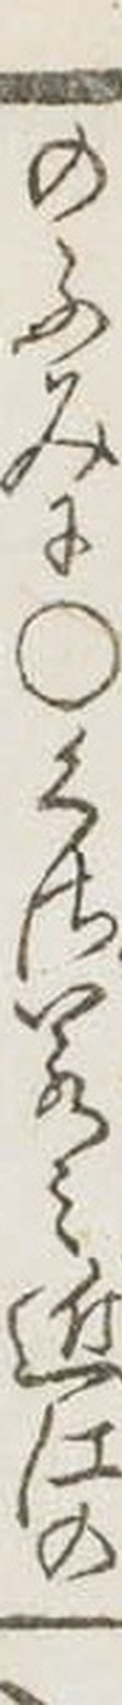のふみに○くさ若み近江の
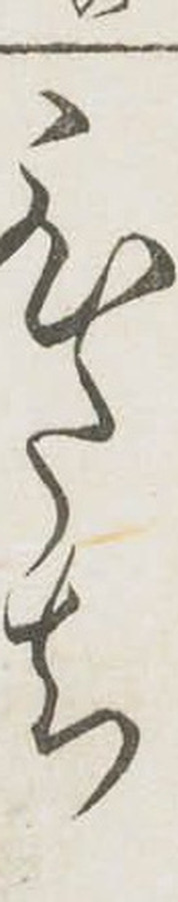ひたち
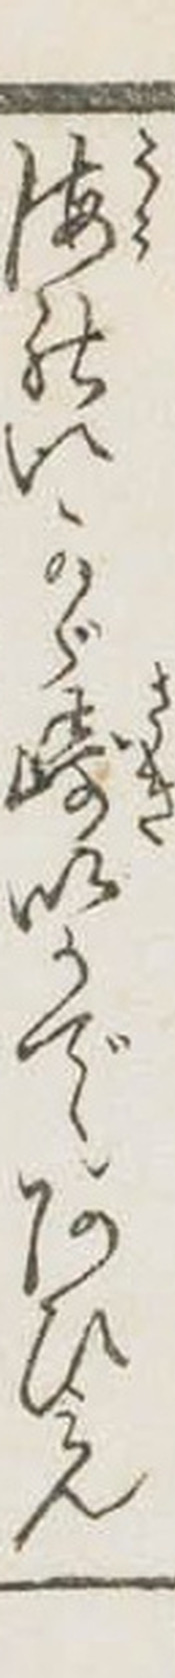海のいかゞ崎いかであひみん
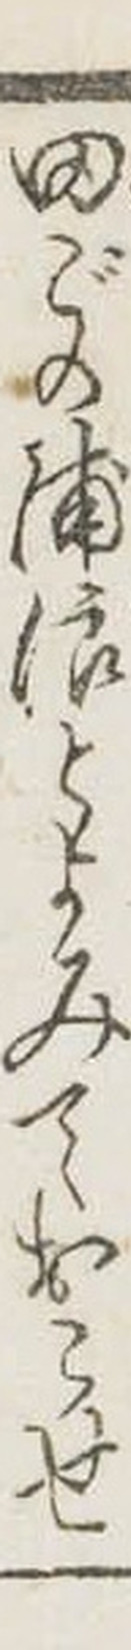田ごの浦浪とよみておこせ
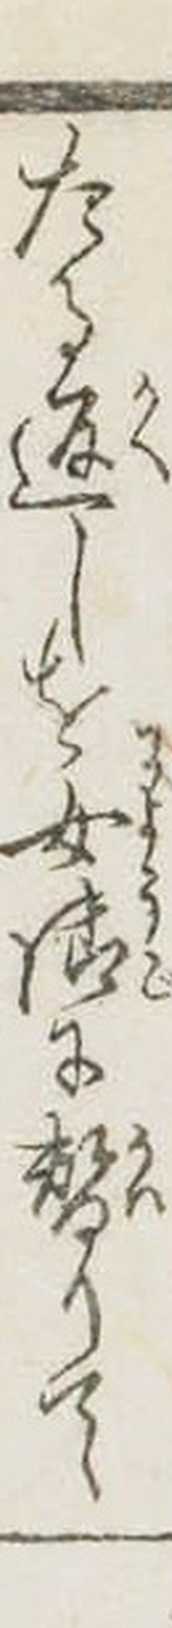たる返しを女御に替りて
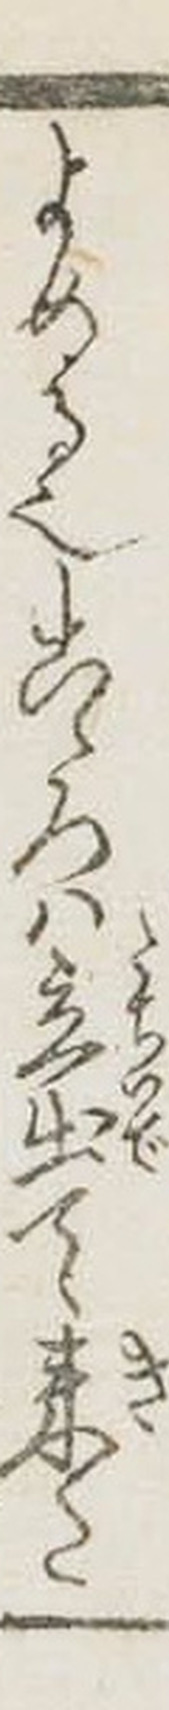よめる也こゝろは立出て来た
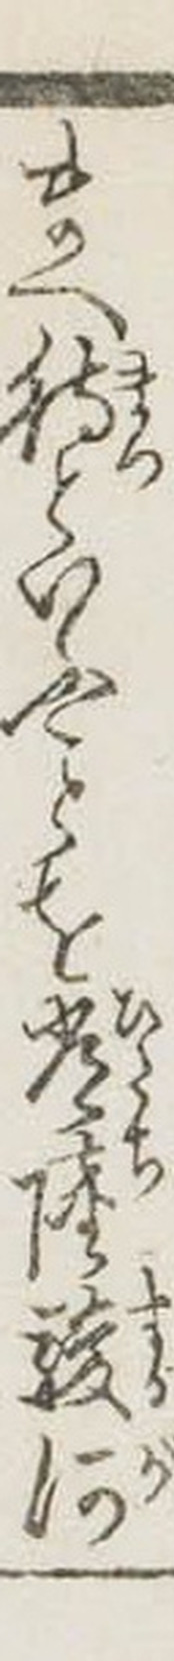まへ待といふことを常陸駿河
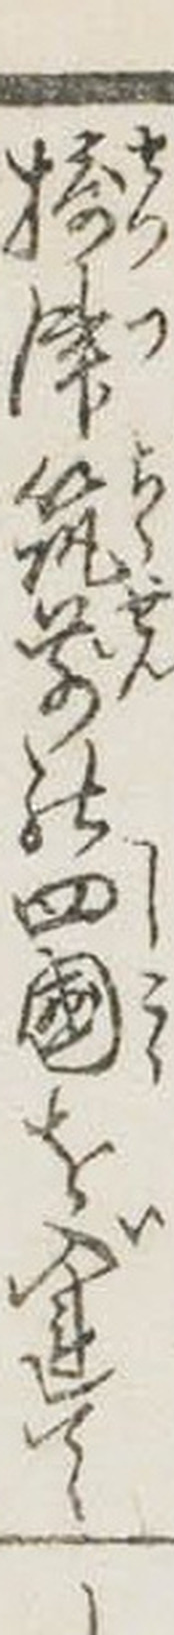摂津筑前の四国を入れて
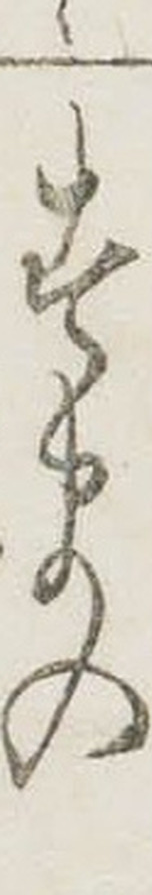すまの
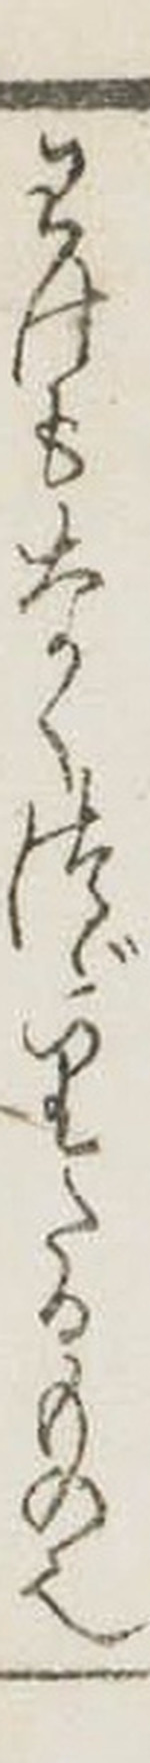わけもなくつゞりたるもの也
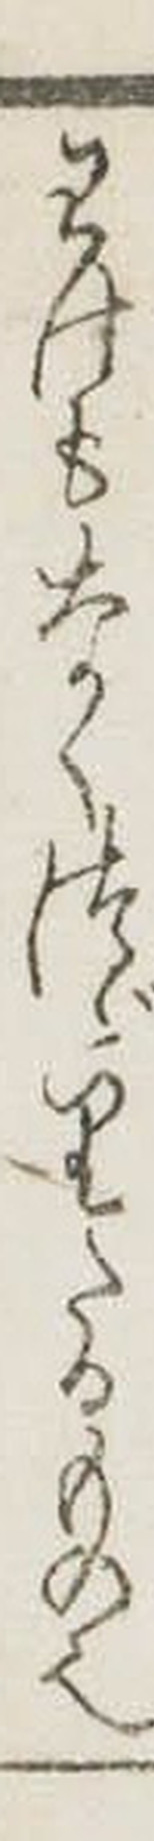わけもなくつゞりたるもの也
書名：源氏百人一首
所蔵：東京学芸大学教育コンテンツアーカイブ
